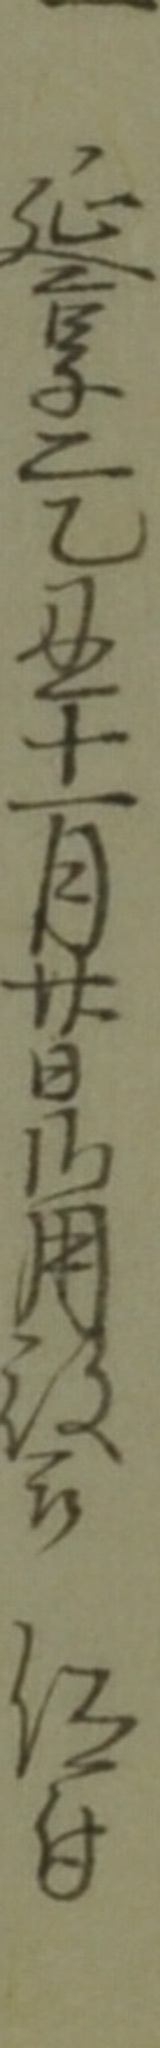一延享二乙丑十一月廿日御用役被仰付
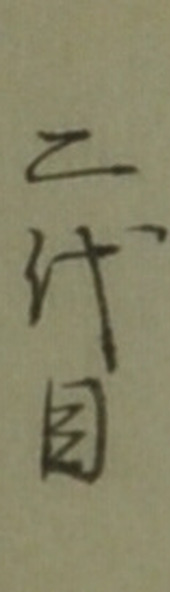二代目
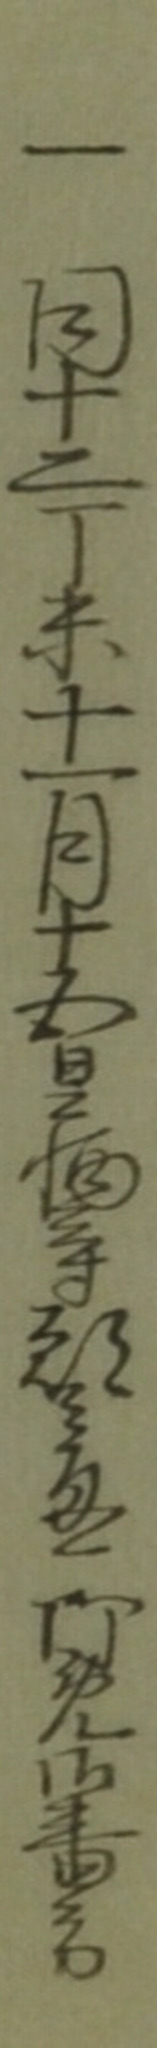一同十二未十一月十五日病気願之通御免御番方
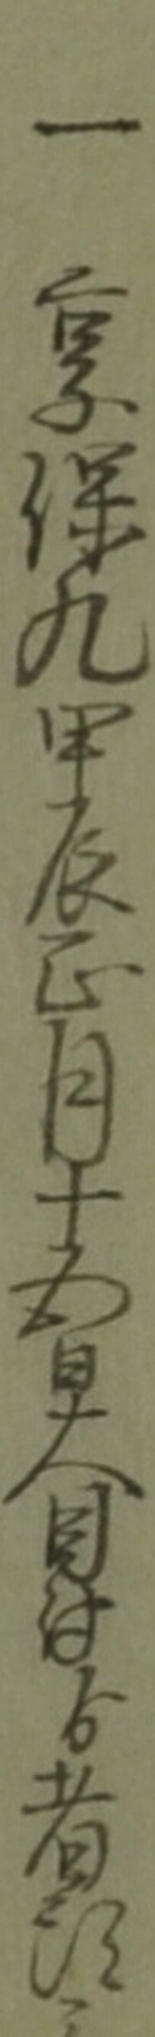一享保九甲辰正月十五日大目付ゟ者頭被
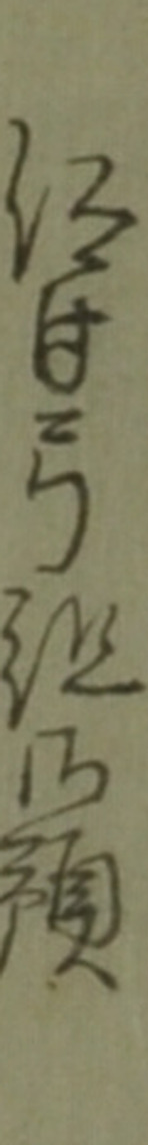仰付弓組御預
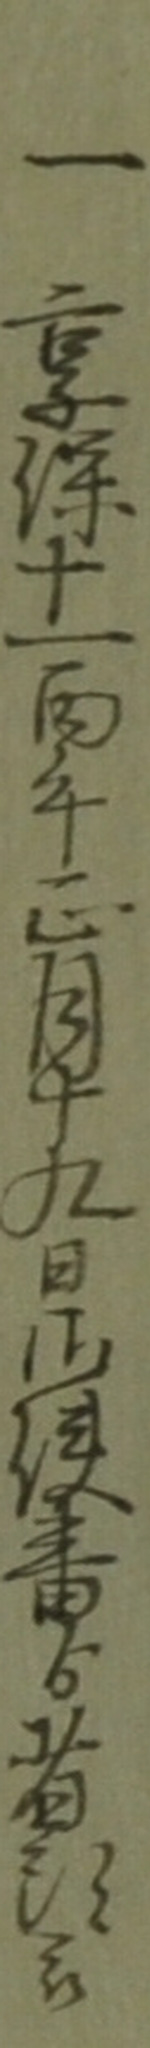一享保十一丙午正月十九日御使番ゟ者頭被
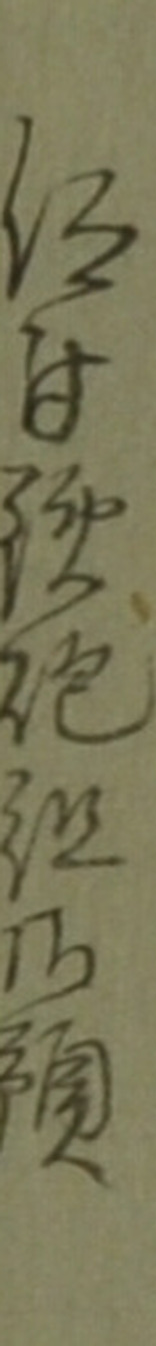仰付鉄砲組御預
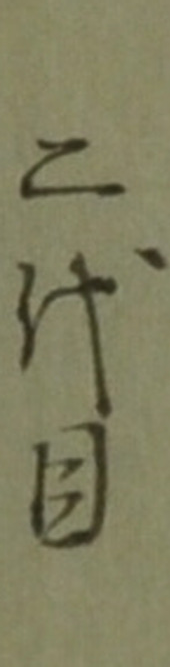二代目
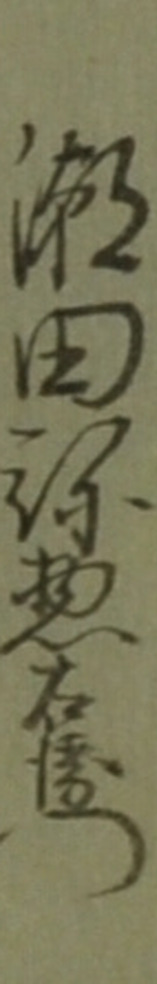瀬田弥惣右衛門
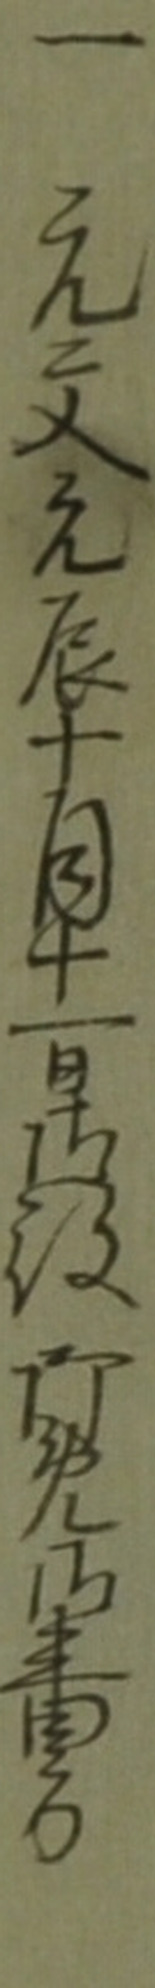一元文元辰十月十一日御役御免御番方
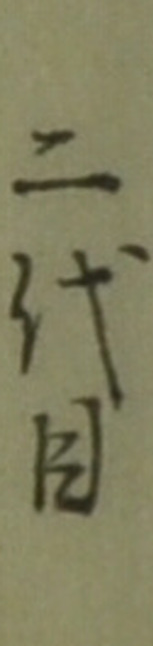二代目
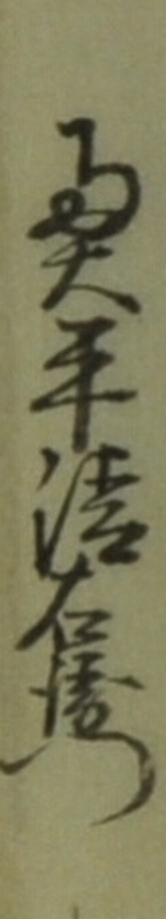奥平清右衛門

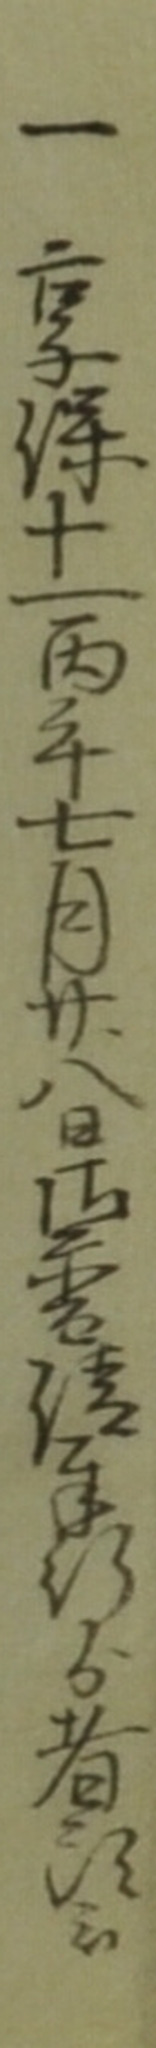一享保十一丙午七月廿八日御普請奉行ゟ者頭被
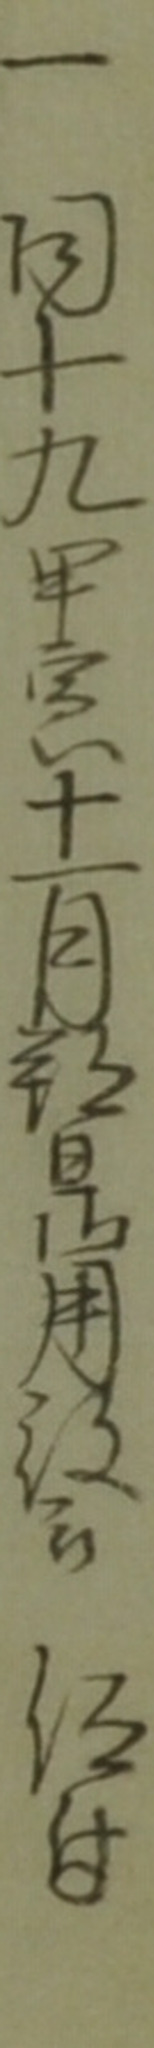一同十九甲寅十一月朔日御用役被仰付
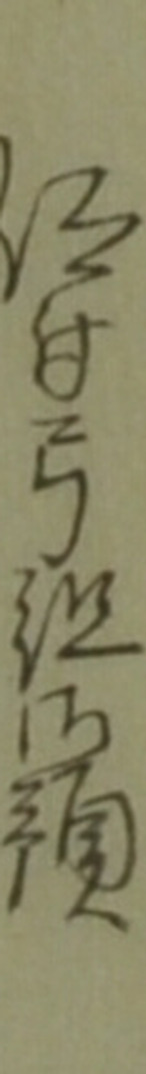仰付弓組御預
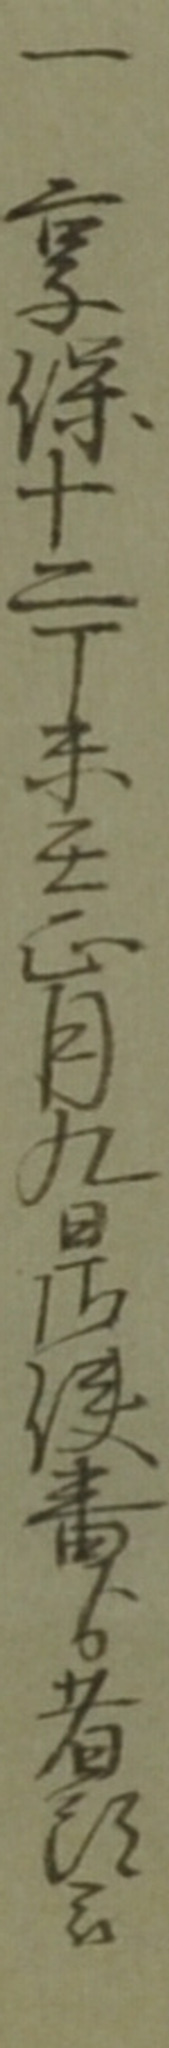一享保十二丁未閏正月九日御使番ゟ者頭被
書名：諸御役代々録（二）
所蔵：伊那市立高遠町図書館・合同会社AMANE
